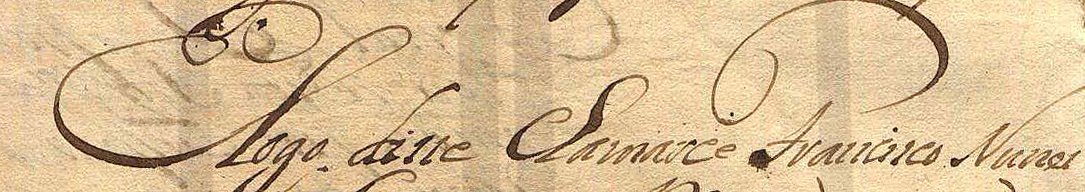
E Logo disse chamarce Francisco Nunes
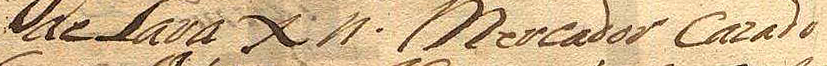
de Lara xn. Mercador cazado
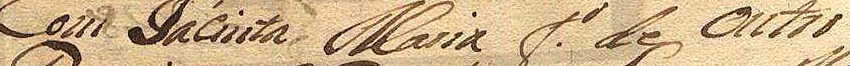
com Iacinta Maria, f.o de outro
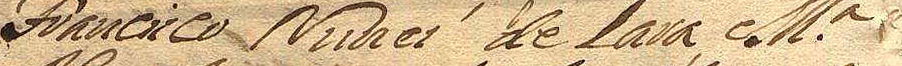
Francisco Nunes de Lara, e M.a
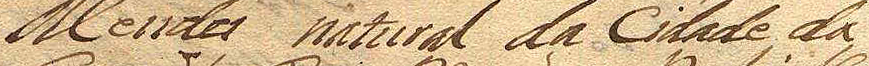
Mendes natural da cidade da
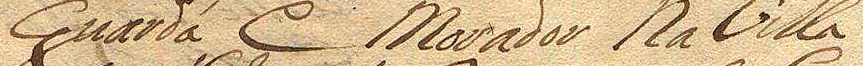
Guarda e Morador Na villa
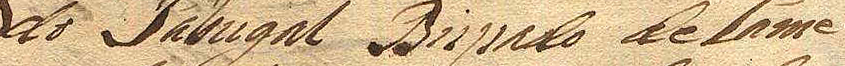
do Sabugal Bispado de Lame
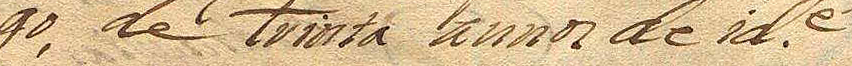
go, de trinta annos de id.e
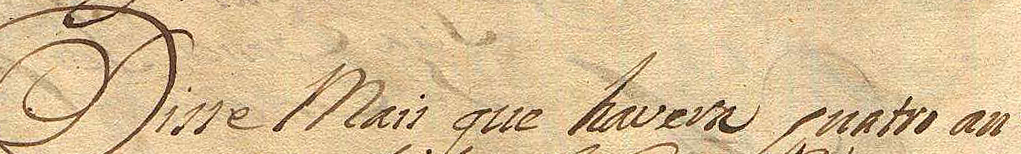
Disse Mais que havera quatro an
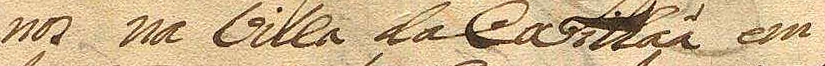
nos na Villa da Covilhaã em
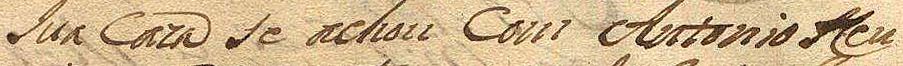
sua caza se achou com Antonio Hen
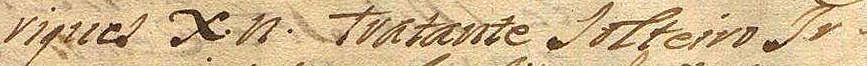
riques x.n. tratante solteiro Ir
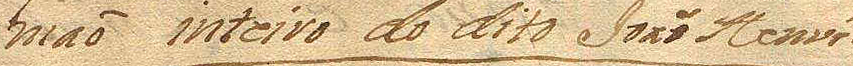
maõ inteiro do dito Ioão Henri
